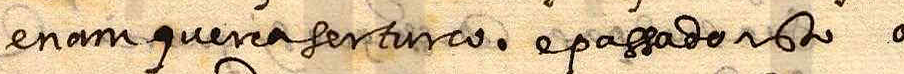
e nam queria ser turco. e passado isto o
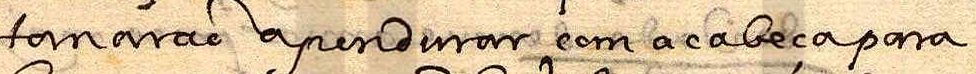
tornaraõ a pendurar com a cabeça para
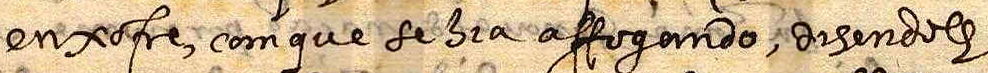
enxofre, com que se hia affogando, dizendolhe
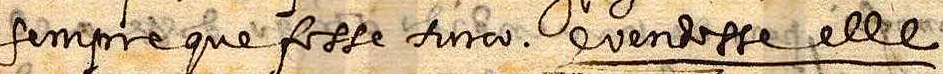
sempre que fosse turco. e vendosse elle
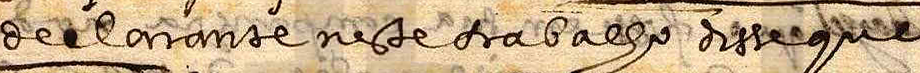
declarante neste trabalho disse que
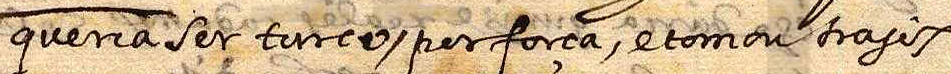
queria ser turco / per força, e tomou trajes
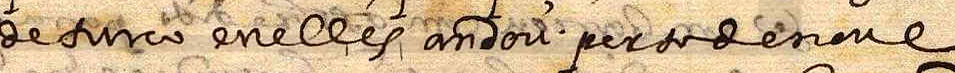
de turco e nelles andou perto de noue
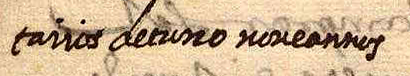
taiios de turco noue annos
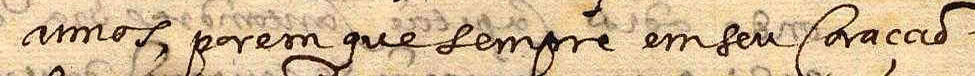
annos, porem que sempre em seu Coraçaõ
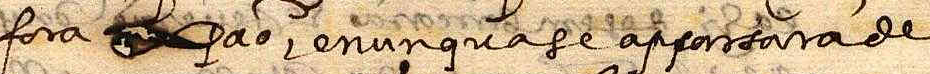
fora Xpaõ, e nunqua se appartara de
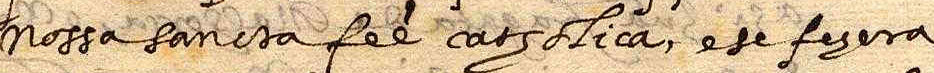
nossa sancta feé catholica, e se fizera
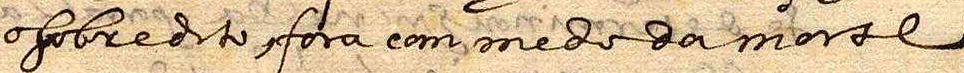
o sobredito, fora com medo da morte
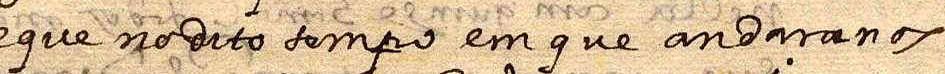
e que no dito tempo em que andara nos
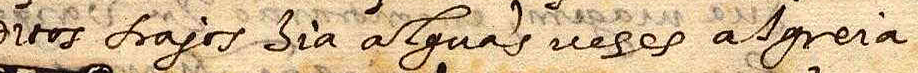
ditos trajos hia alguãs uezes a Igreia
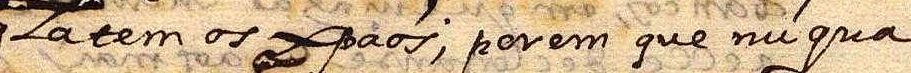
q̄ La tem os Xpaõs; porem que nūqua
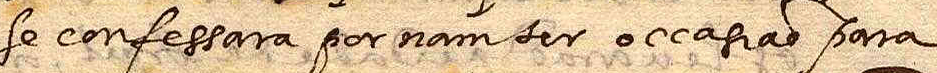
se confessara por nam ser occasiaõ para
